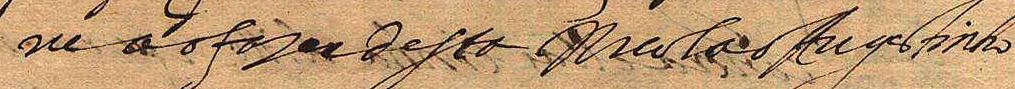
ue ao fazer desta nicolao Augostinho
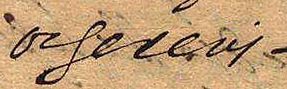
o escreuj
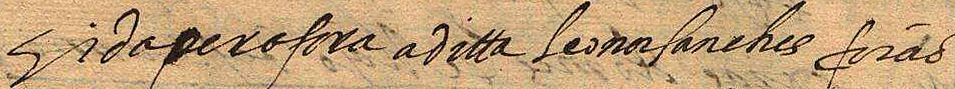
E ida pera fora a ditta Leonor Sanches foraõ
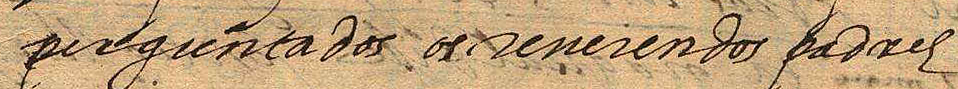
perguntados os reuerendos padres
